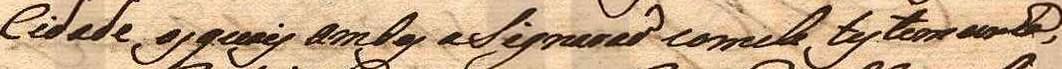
Cidade os quais ambos aSignaraõ com ele testemunha,
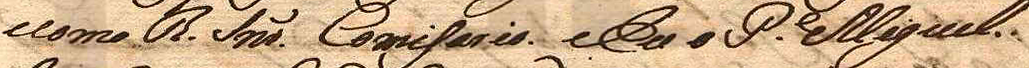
e com o R. snr̄ Comisario. e Eu o P.e Miguel.
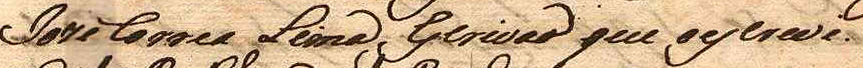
Ioze Correa Lima Escrivaõ que o escrevi.
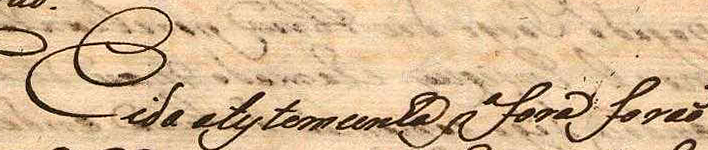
E ida a testemunha pa fora foraõ
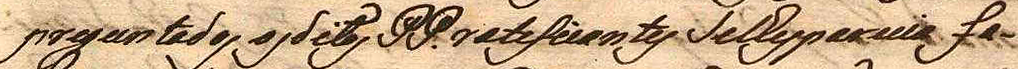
preguntados os ditos PP. rateficantes se lhes parecia fa
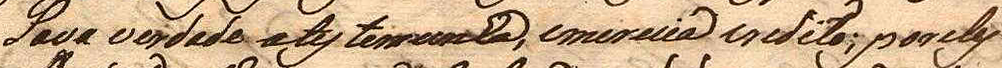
Lava verdade a testemunha, e merecia credito, por eles
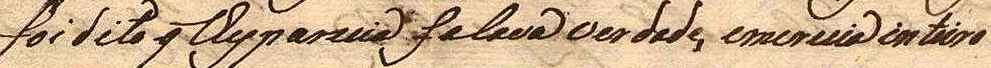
foi dito q̄ lhes parecia falava verdade, e merecia inteiro
